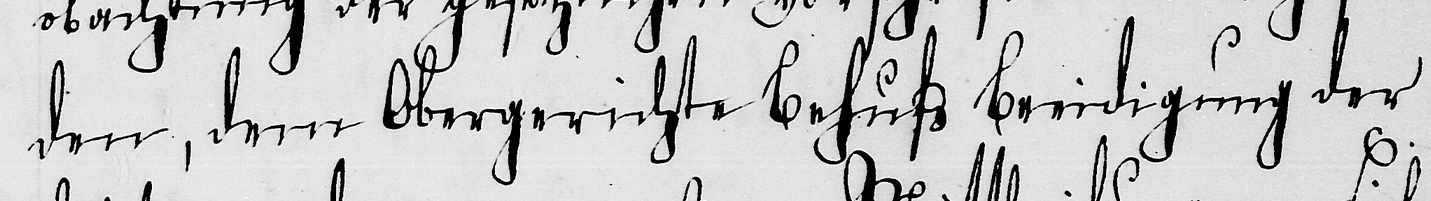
den, dem Obergerichte Behufs Beeidigung der
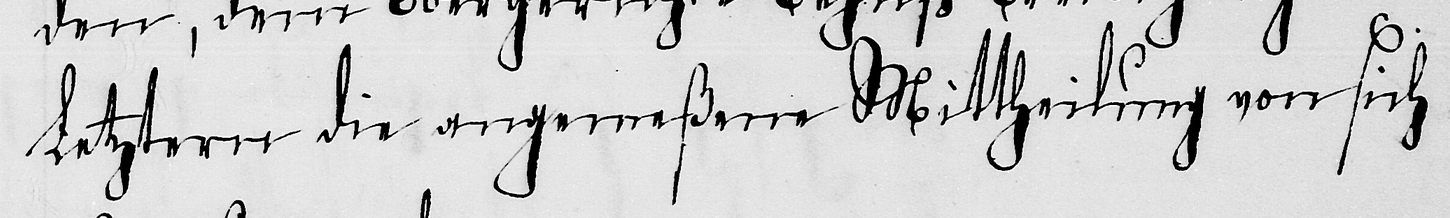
Letztern die angemeßene Mittheilung von sich
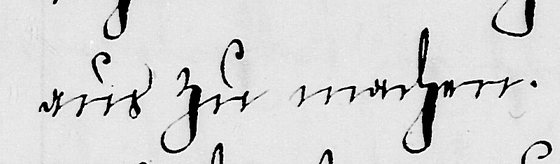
aus zu machen.
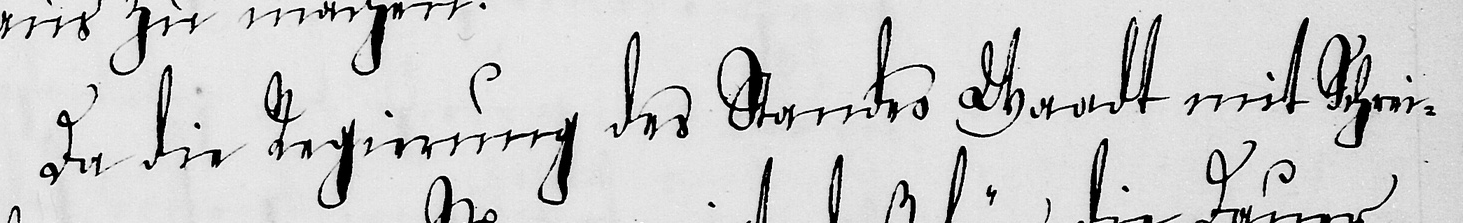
Da die Regierung des Standes Waadt mit Schre¬
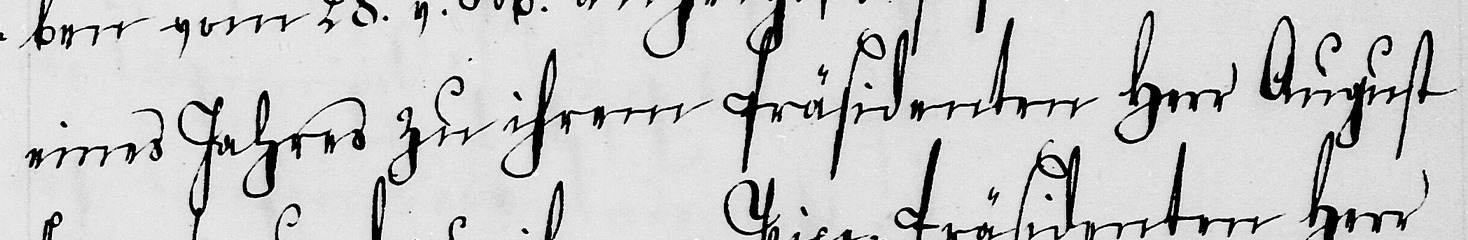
eines Jahres zu ihrem Präsidenten Herr August
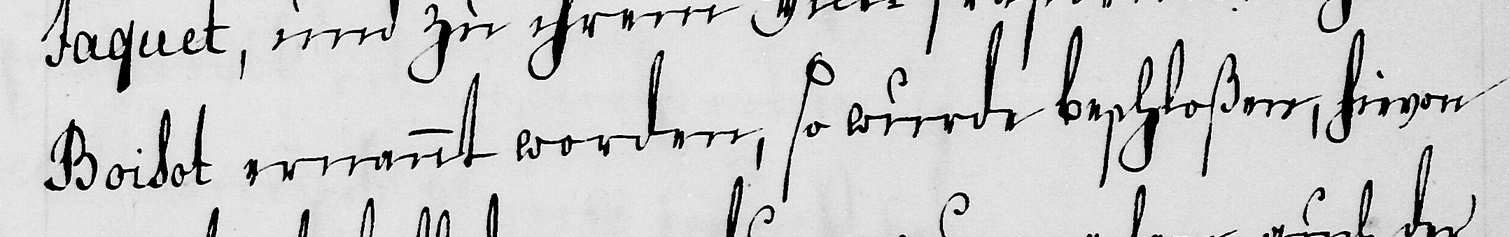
Boisot ernannt worden, so wurde beschloßen, hievon
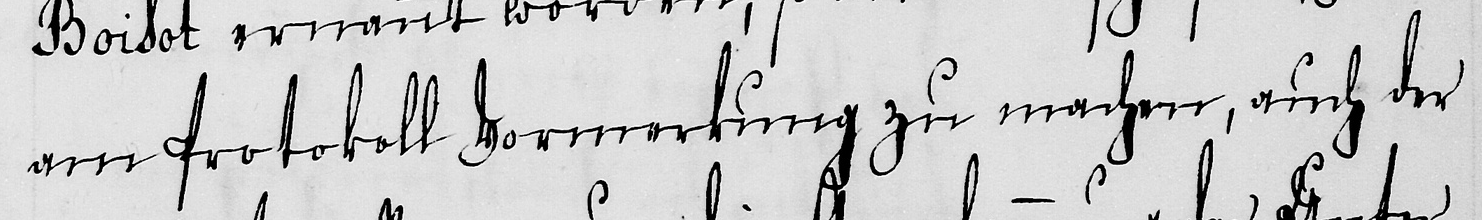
am Protokoll Vormerkung zu machen, auch der
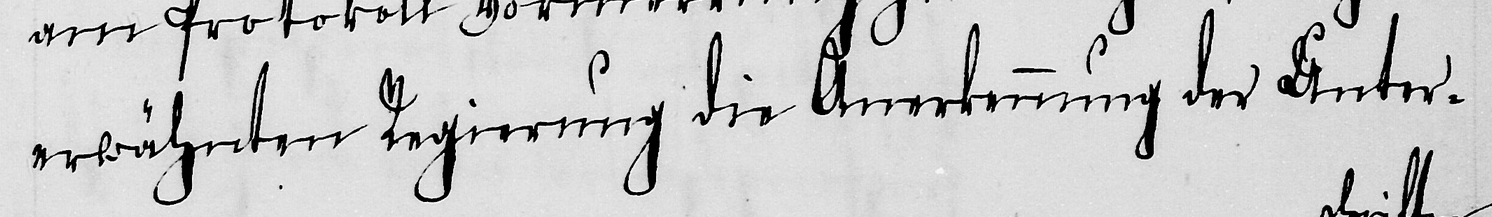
erwähnten Regierung die Anerkennung der Unter-
